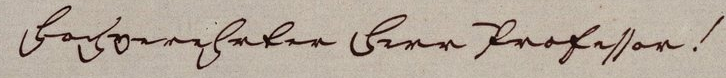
Hochverehrter Herr Professor!
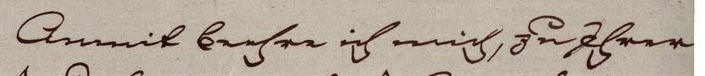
Anmit beehre ich mich, zu Ihrer
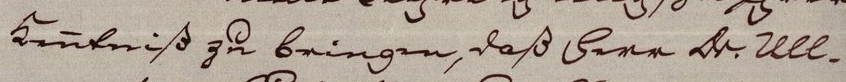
Kenntniß zu bringen, daß Herr Dr. Ull-
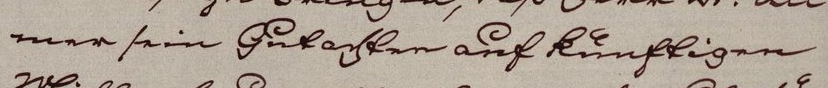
mer sein Gutachten auf künftigen
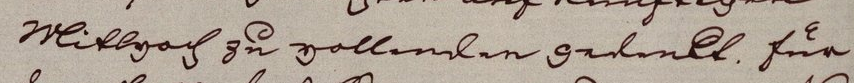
Mitwoch zu vollenden gedenkt. Für
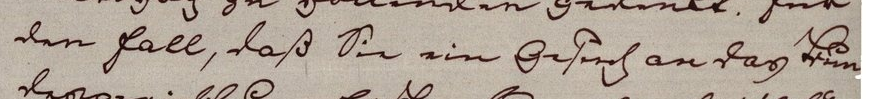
den Fall, daß Sie ein Gesuch an das Bun-
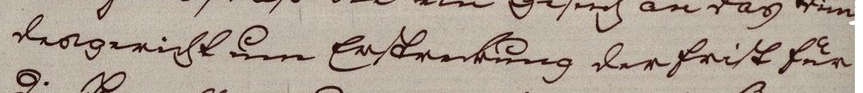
desgericht um Erstreckung der Frist für
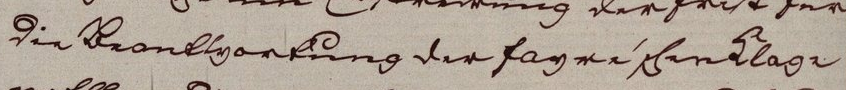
die Beantwortung der Favre'schen Klage
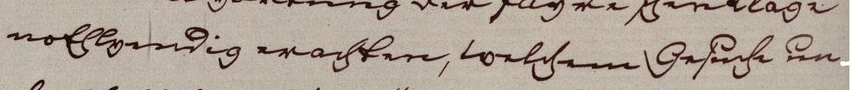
nothwendig erachten, welchem Gesuche un-
